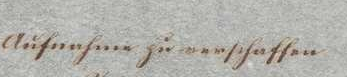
Aufnahme zu verschaffen.
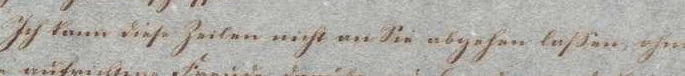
Ich kann diese Zeilen nicht an Sie abgehen lassen, ohne
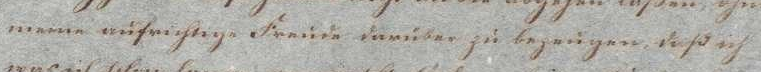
meine aufrichtige Freude darüber zu bezeugen, daß ich,
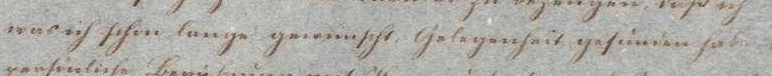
was ich schon lange gewünscht, Gelegenheit gefunden habe, in
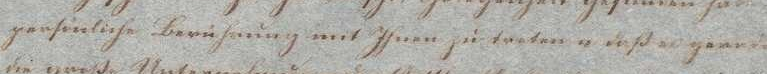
persönliche Berührung mit Ihnen zu treten & daß es gerade
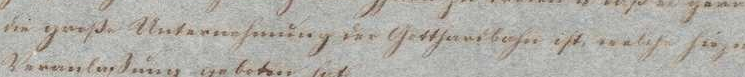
die große Unternehmung der Gotthardbahn ist, welche hiezu
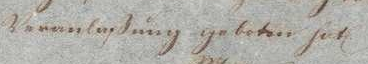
Veranlaßung geboten hat.
